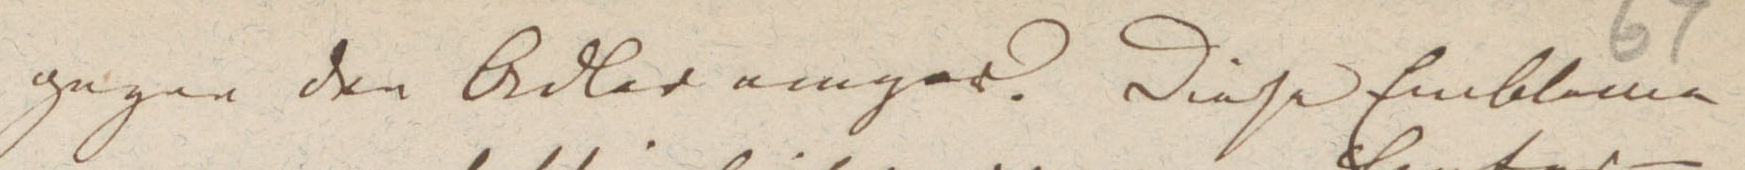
gegen den Adler empor. Diese Embleme
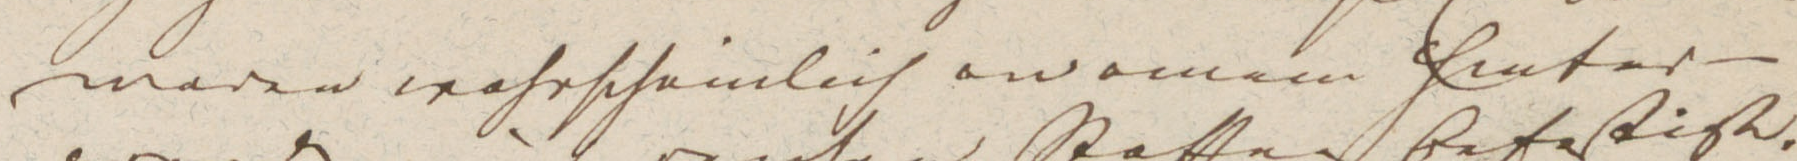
waren wahrscheinlich an einem Hinter-
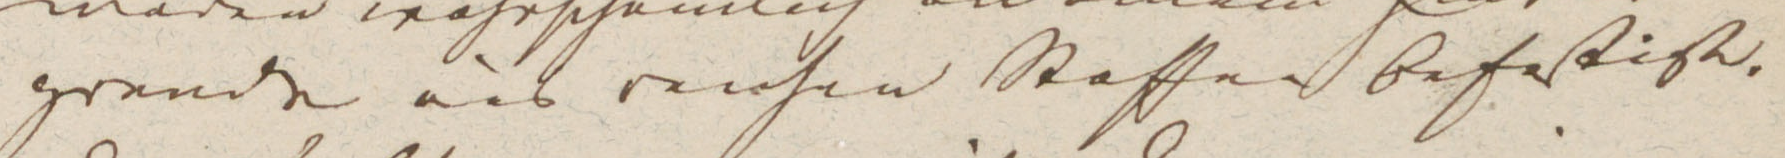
grunde aus reichen Stoffen befestigt.
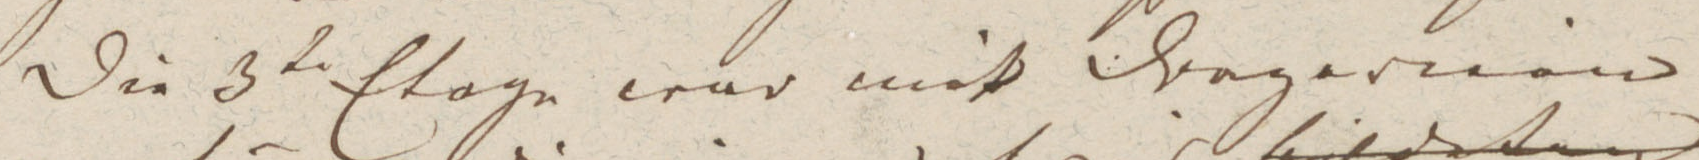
Die 3te Etage war mit Draperieen
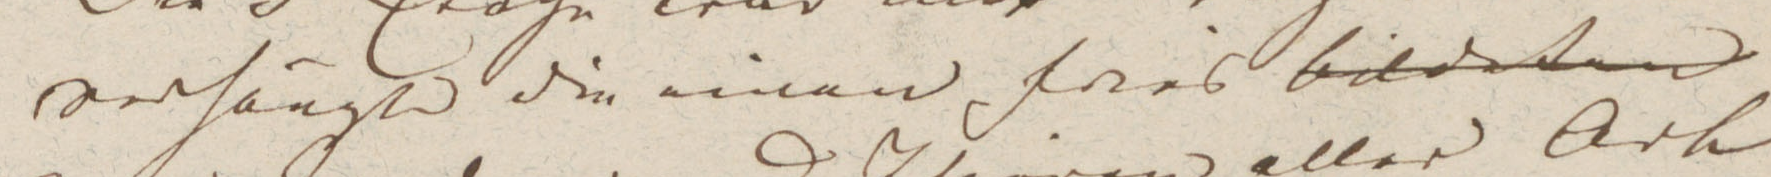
verhängt die einen Fries bildeten
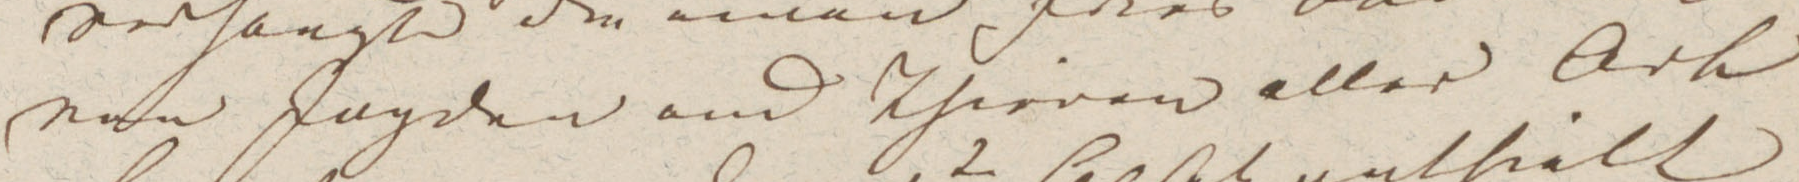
von Jagden und Thieren aller Art
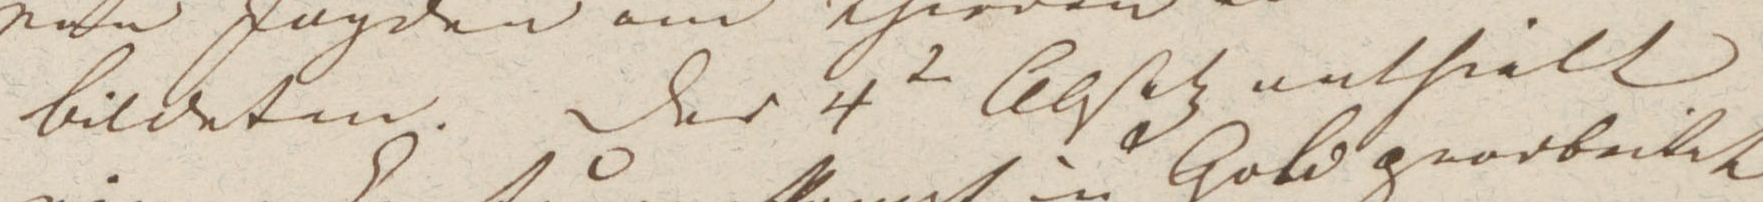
bildeten. Der 4t Absatz enthielt
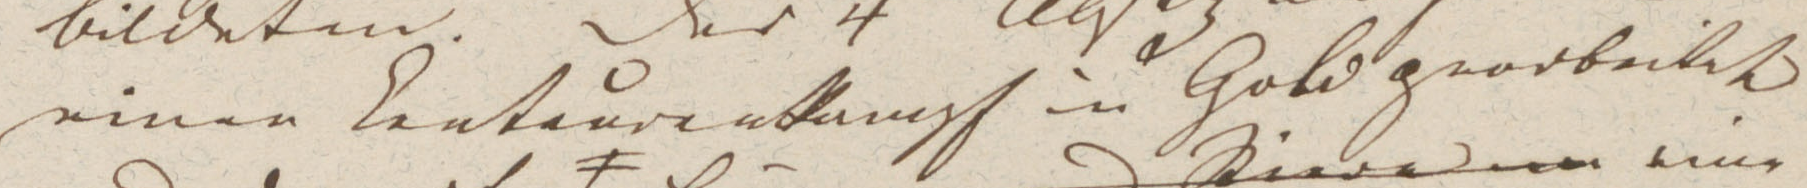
einen Centaurenkampf in Gold gearbeitet
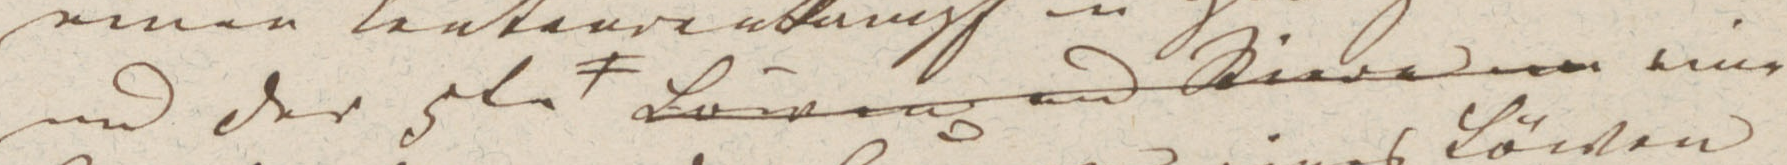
und der 5te % Löwen und Stiere eine
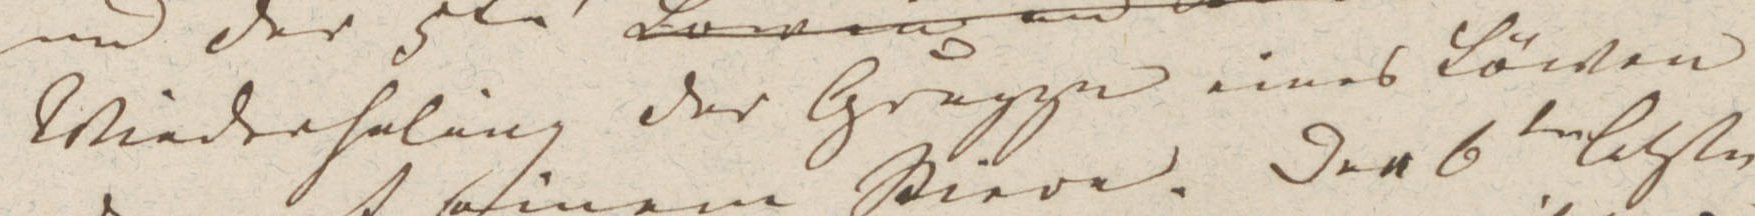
Wiederholung der Gruppe eines Löwen
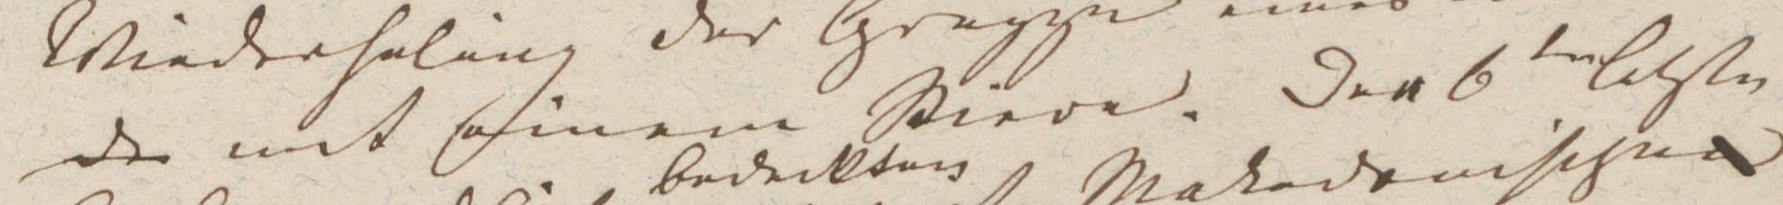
d mit einem Stiere. Dern 6ten letzte
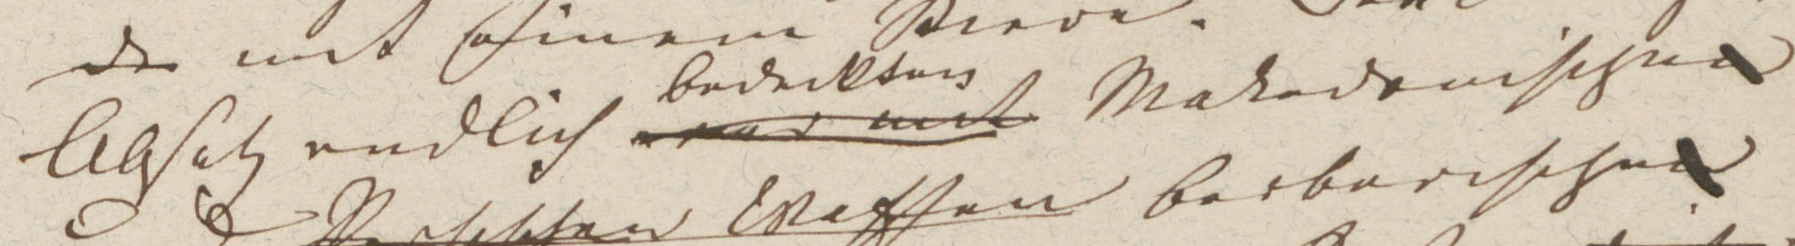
Absatz endlich war mit bedeckten Makedonischen
